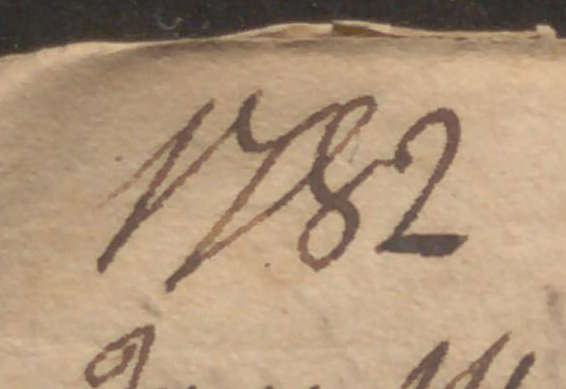1782
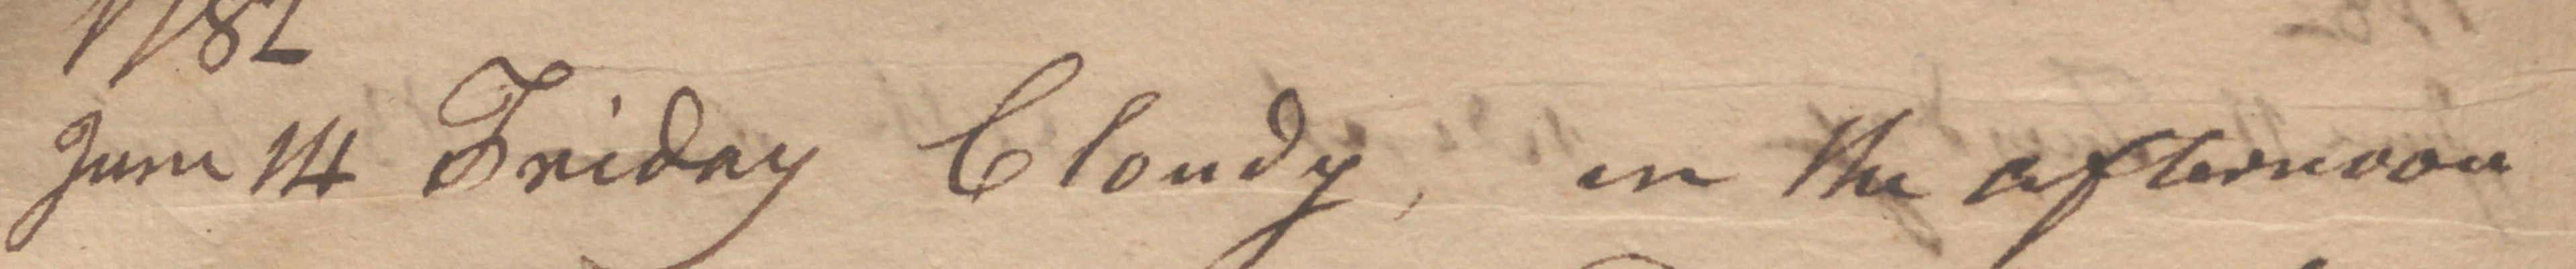June 14 Friday Cloudy, in the afternoon
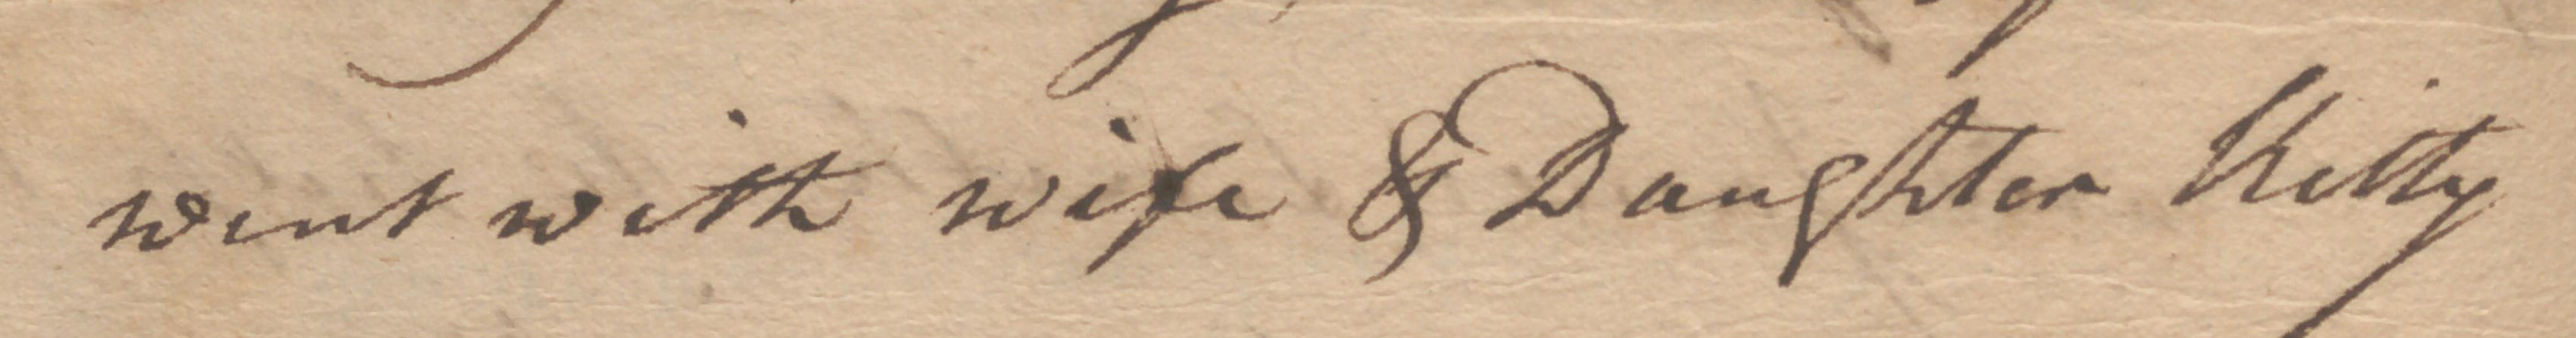went with wife & Daughter Kitty
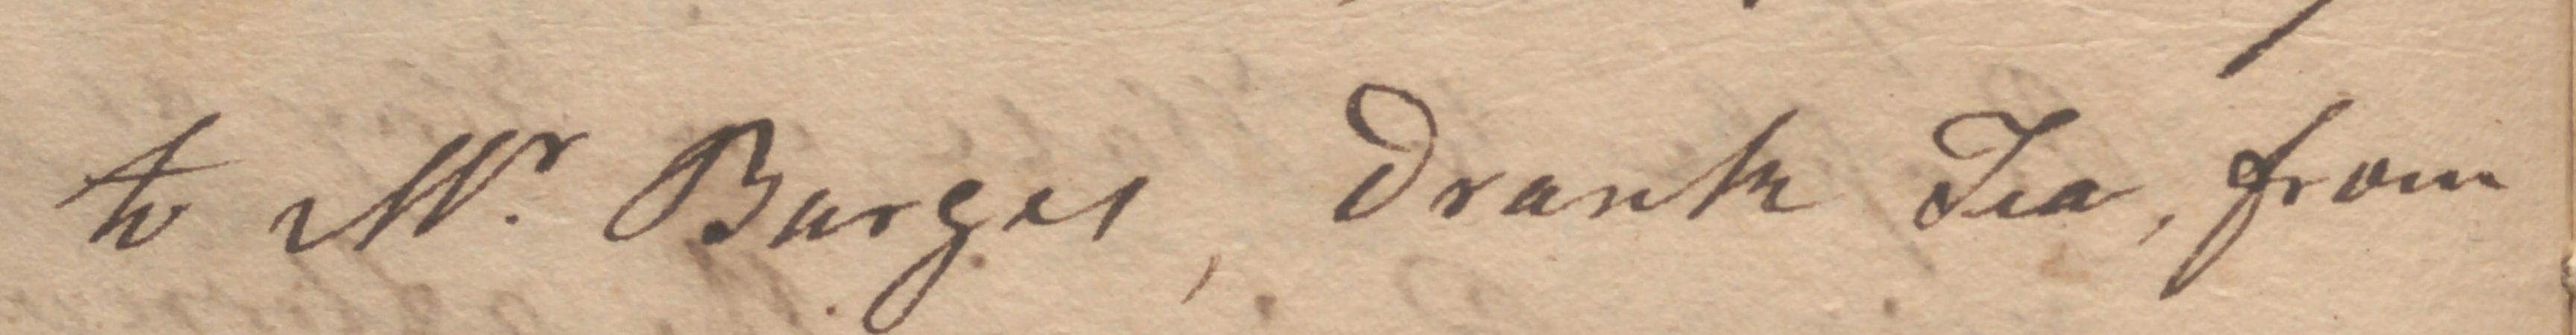to M^r. Barges, drank Tea, from
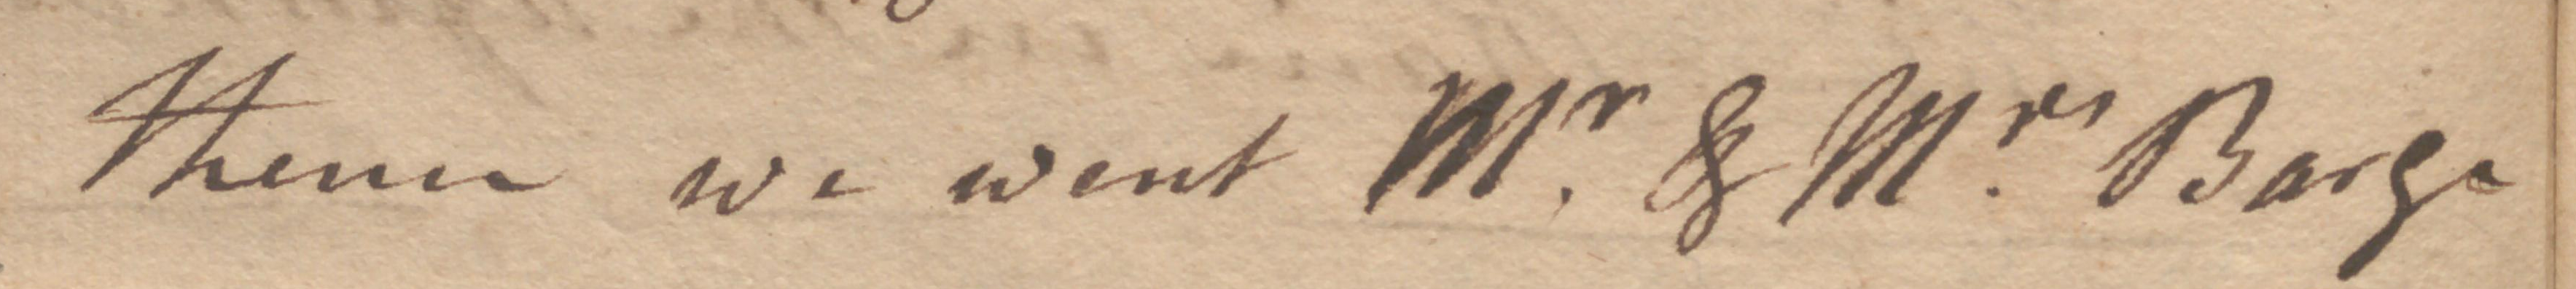thence we went M^r. & M^rs. Barge
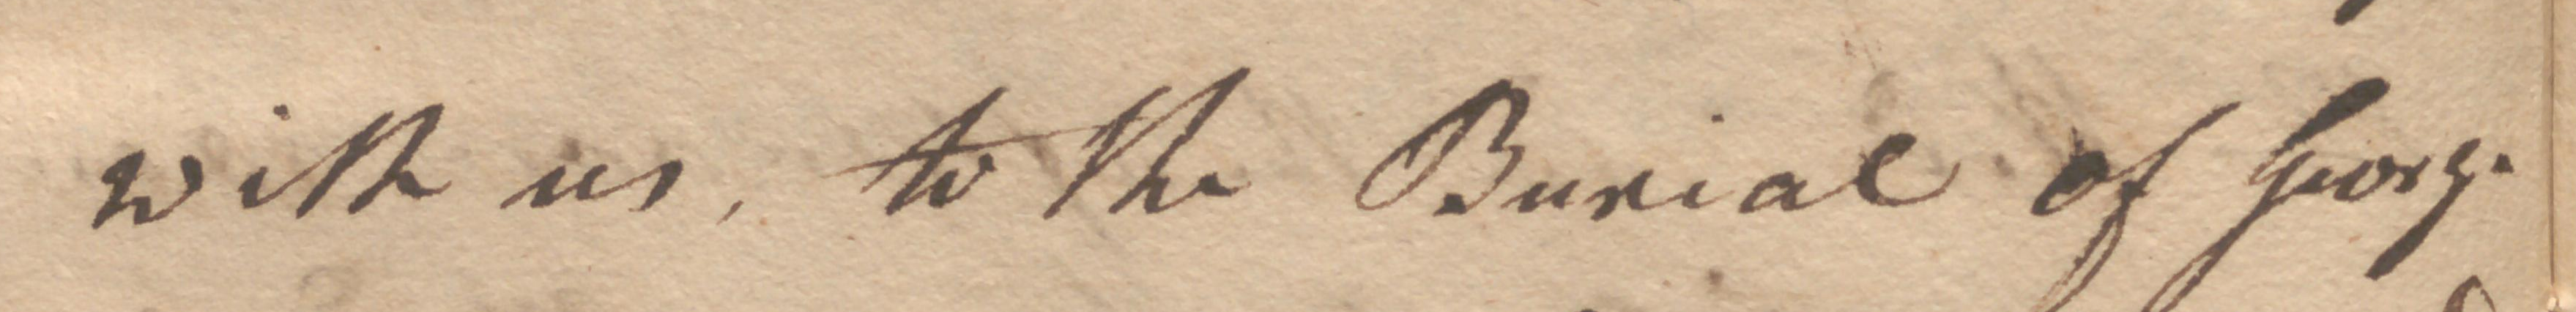with us, to the Burial of George
